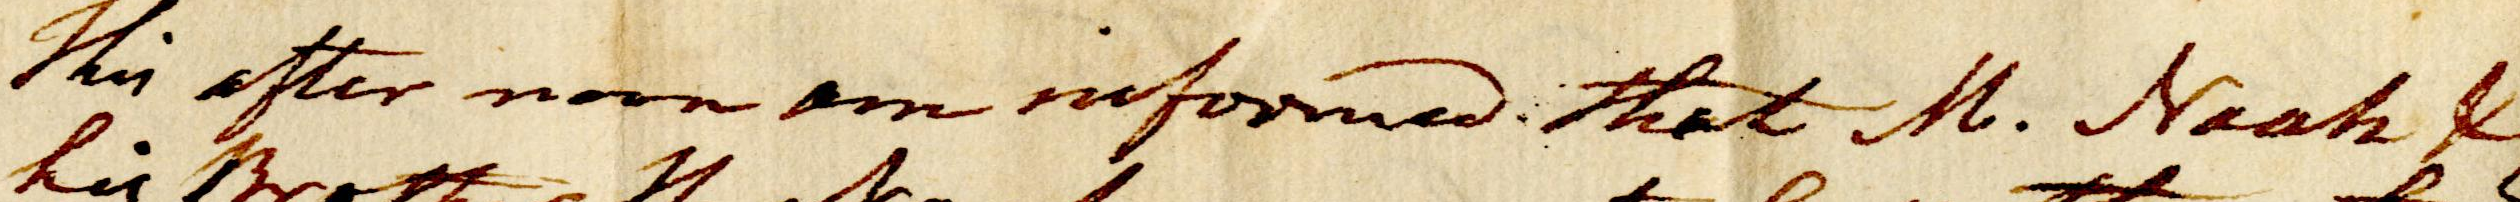this after noon am informed that M. Noah &
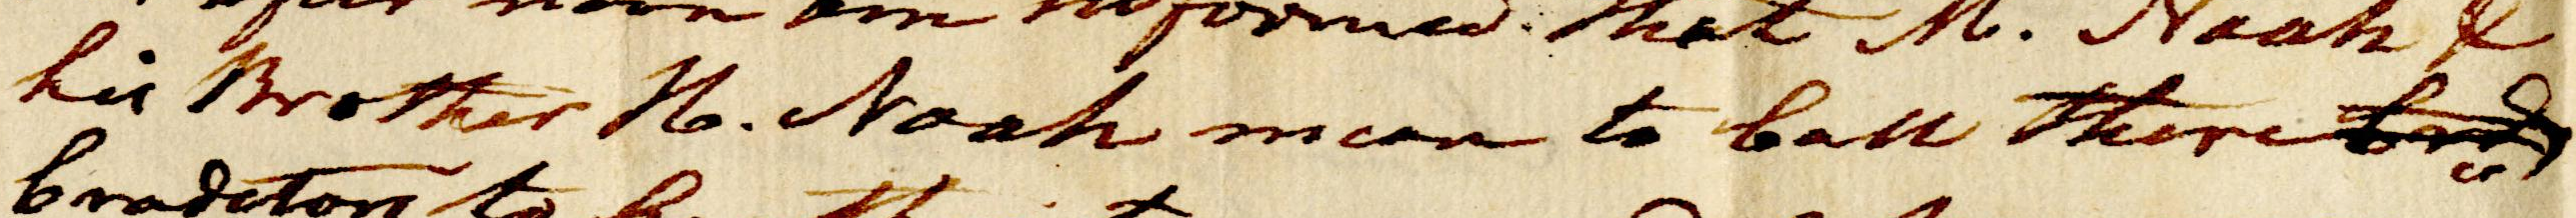his brother N. Noah mean to call there [____]
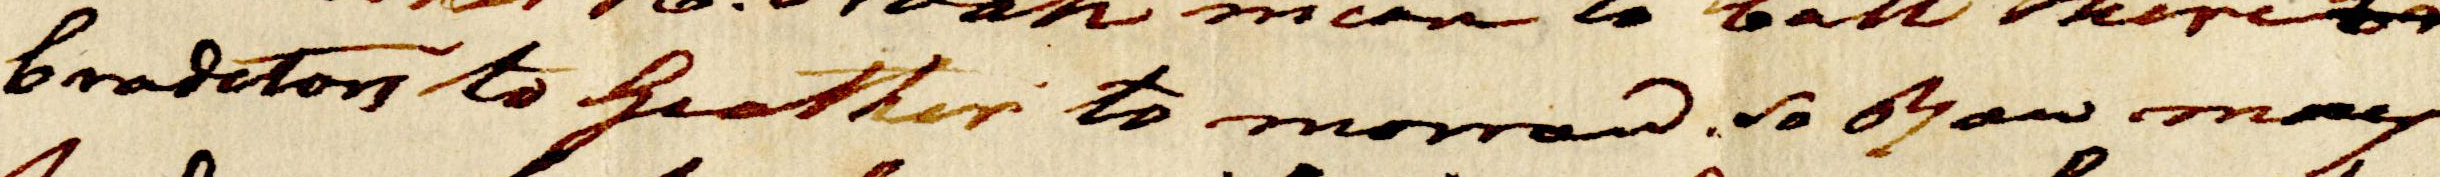creditors to gather to morrow so you may
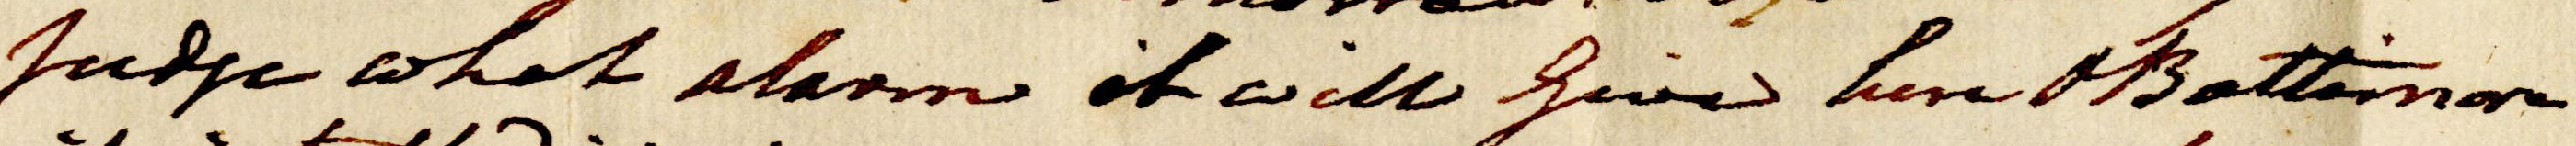judge what alarm it will give here & Baltimore
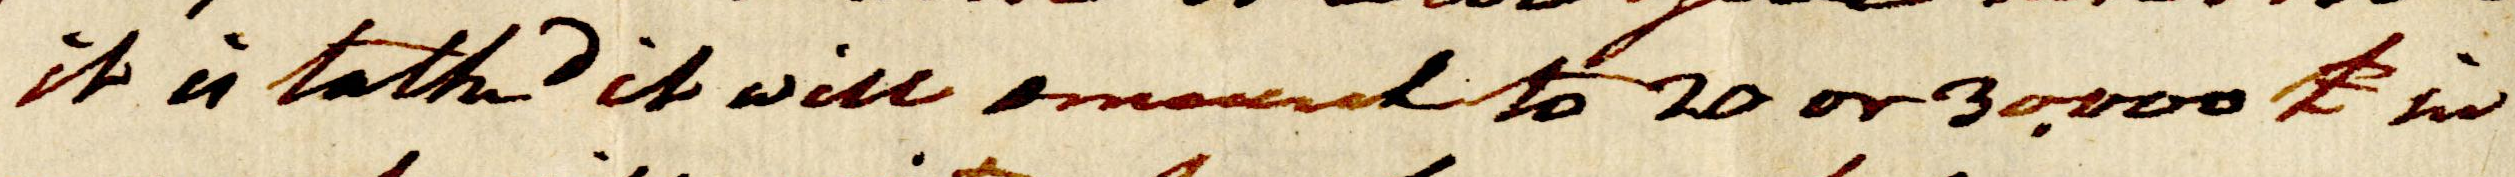it is talked it will amount to 20 or 30000 £ in
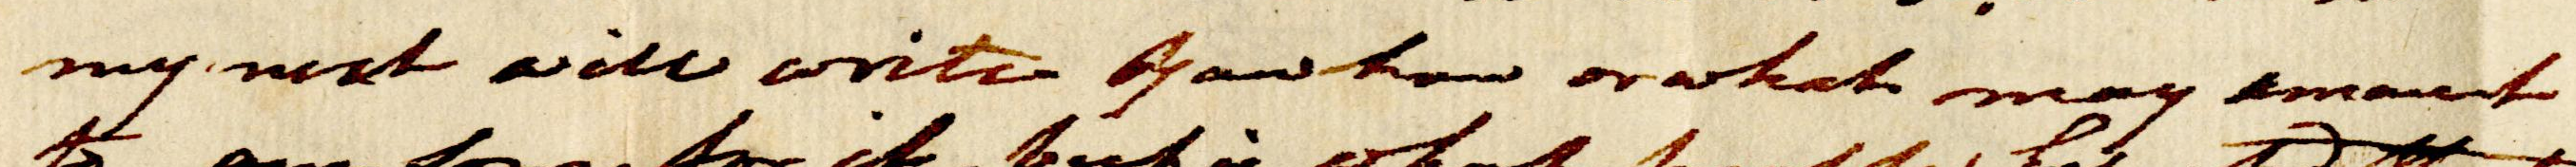my next will write you how market may amount
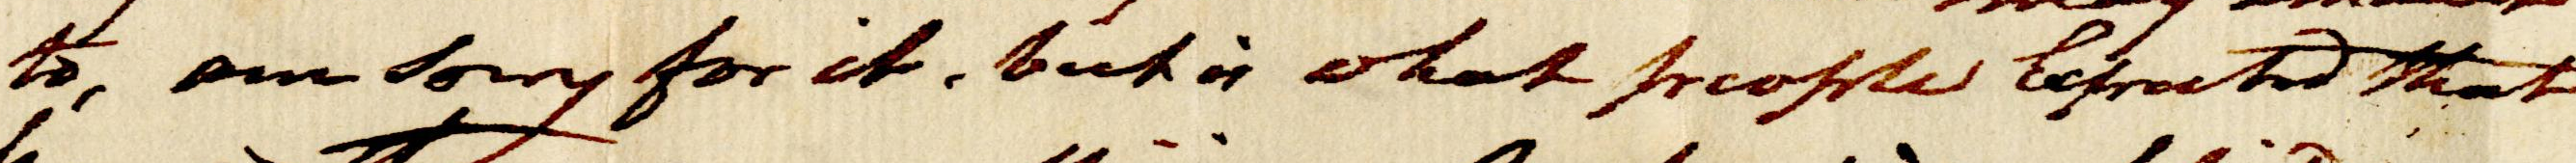to, am sorry for it. but is what people Expected that
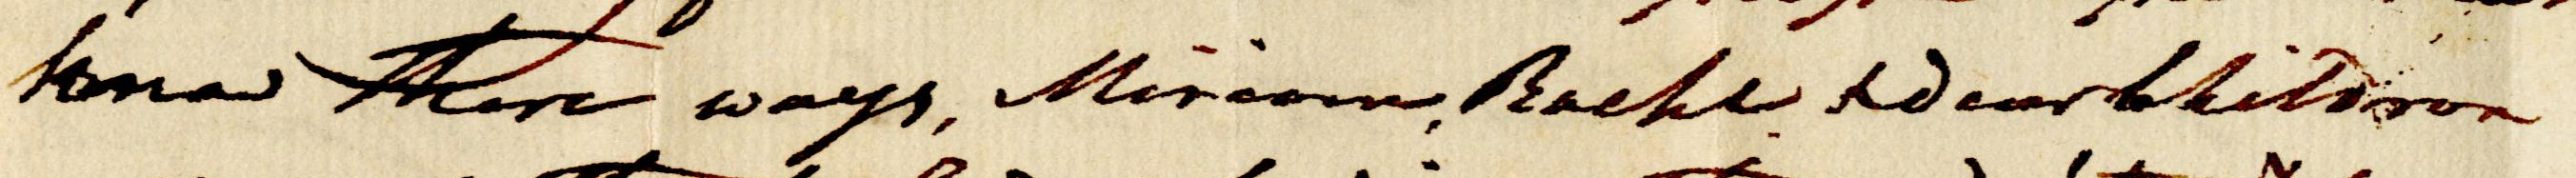know there ways, Miriam Rachl & our children
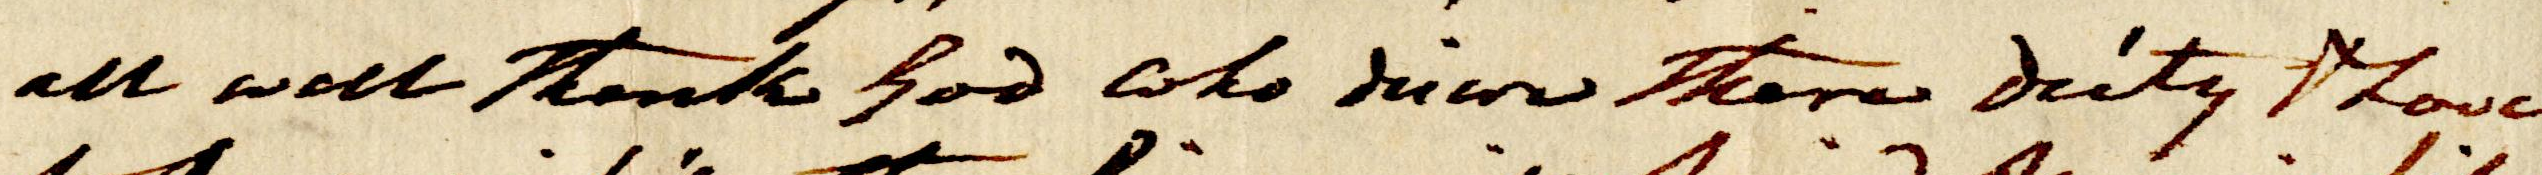all well thank God who desire there duty & Love
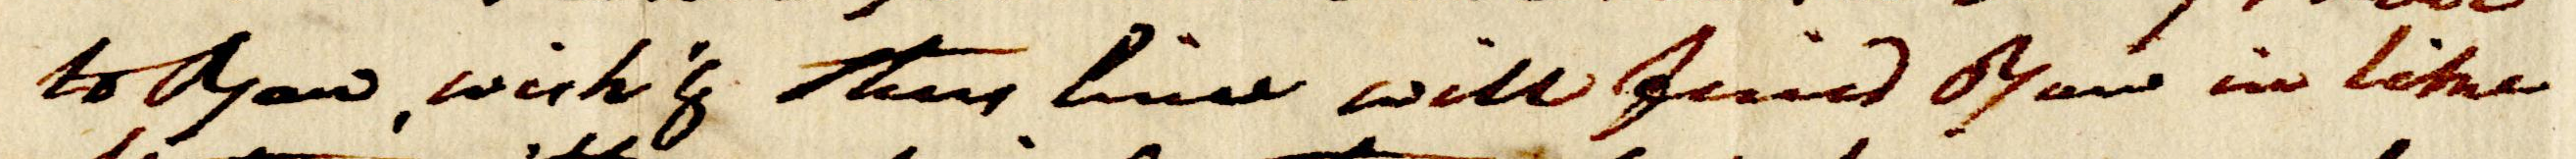to you, wish'g this line will find you in like
